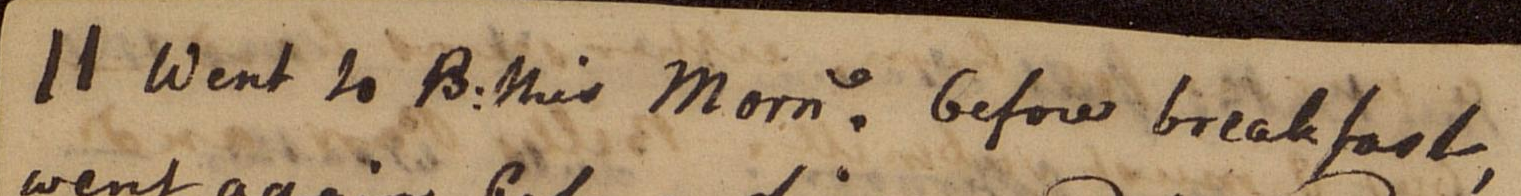11 Went to B: this Morn^g. before breakfast,
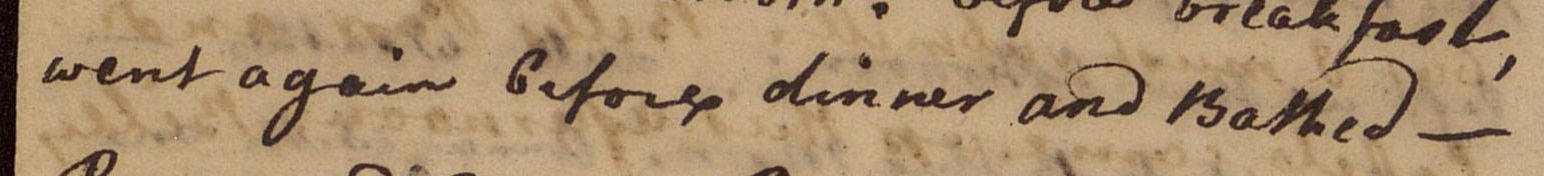went again before dinner and Bathed-
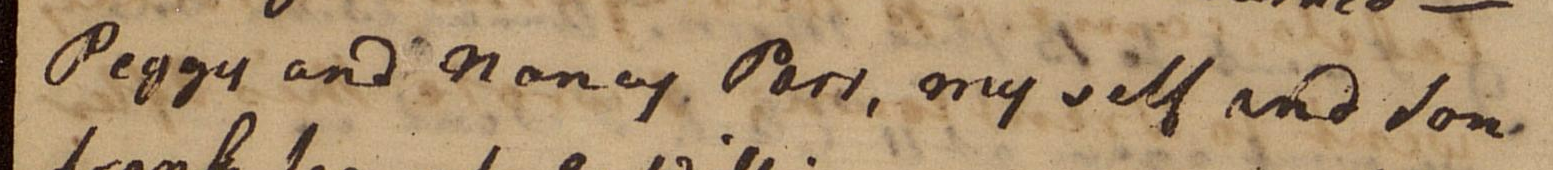Peggy and Nancy Parr, my self and son
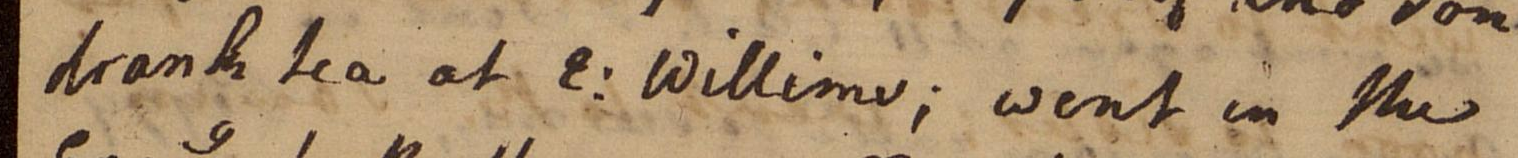drank tea at E: Willims; went in the
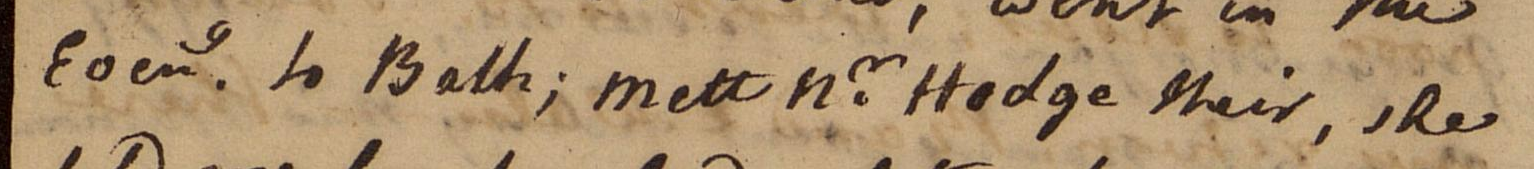Even^g. to Bath; mett N^r. Hodge their, she
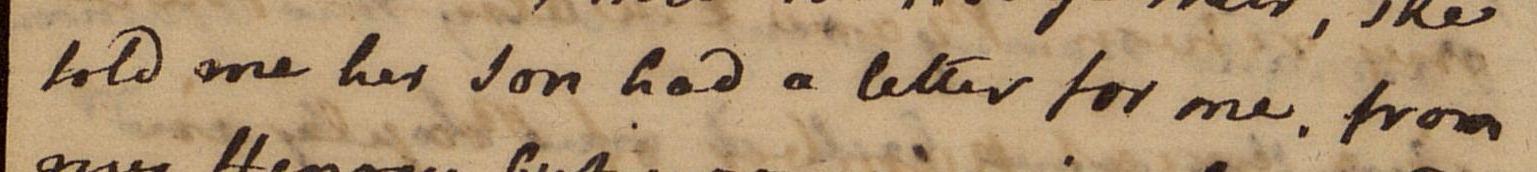told me her son had a letter for me, from
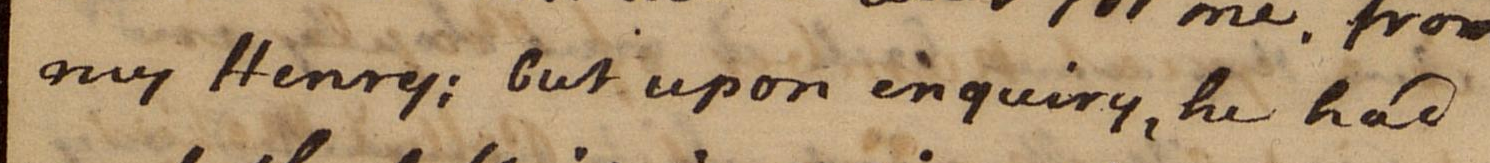my Henry; but upon inquiry, he had
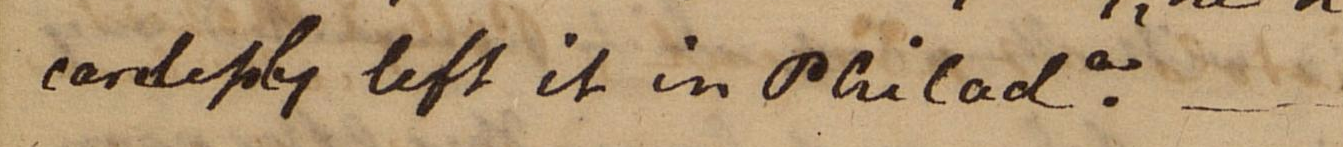carelessly left it in Philad^a.-
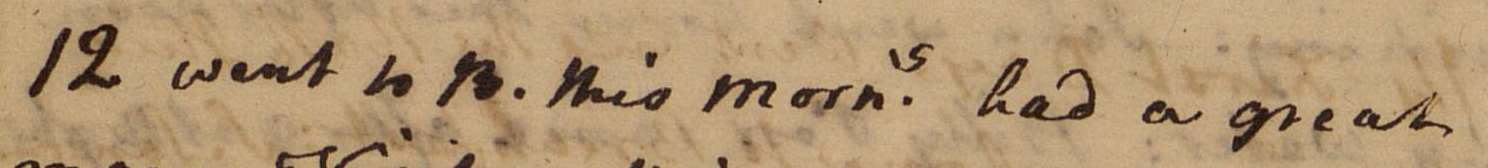12 went to B. this morn^g. had a great
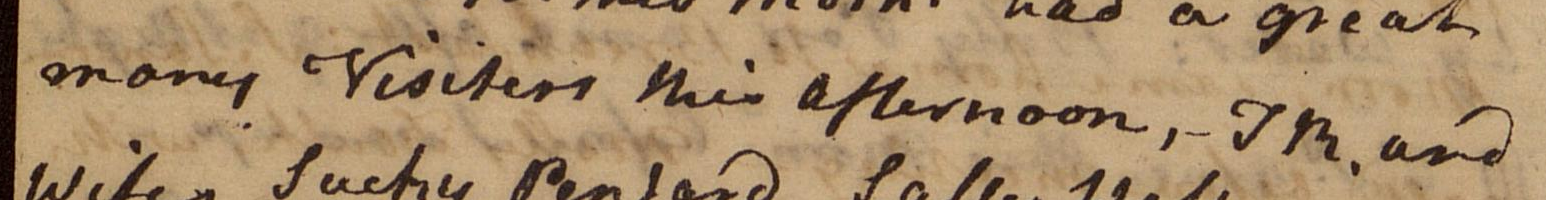many Visiters this afternoon,- TR, and
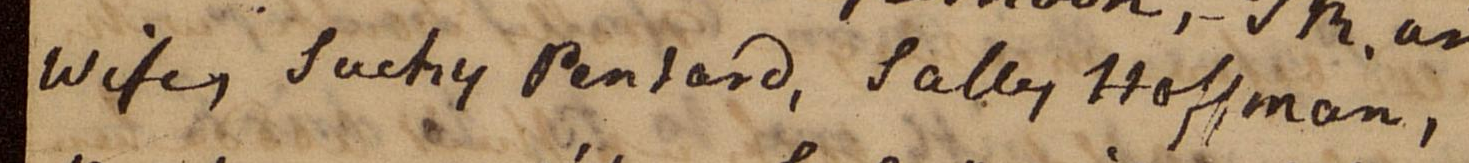wife, Sueky Pentard, Sally Hoffman,
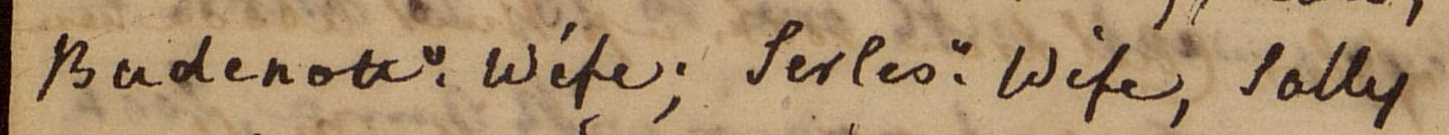Budenot^s Wife; Serles^s Wife, Sally
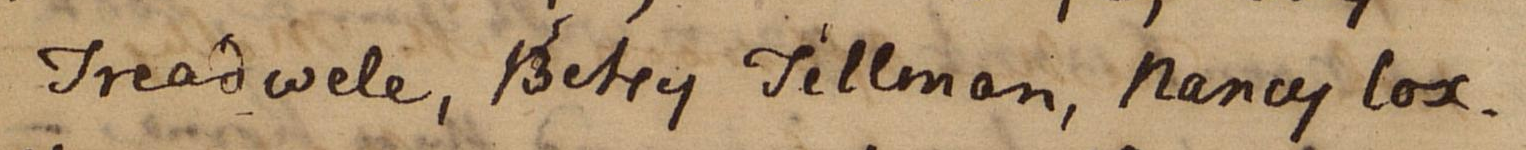Treadwele, Betsy Tillman, Nancy Cox-
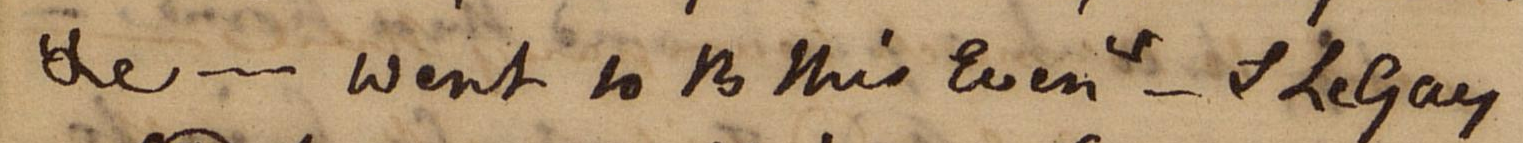&c- went to B this Even^g- S LeGay
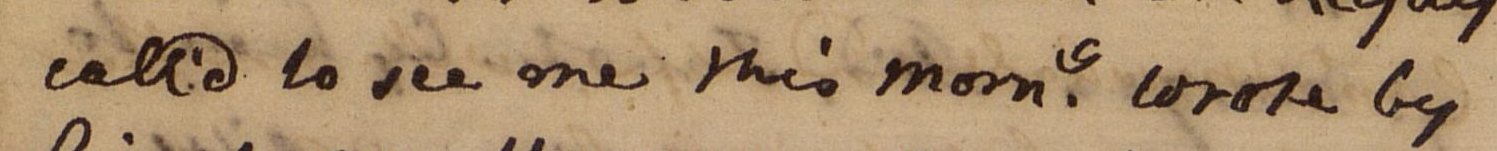call'd to see me this morn^g. wrote by
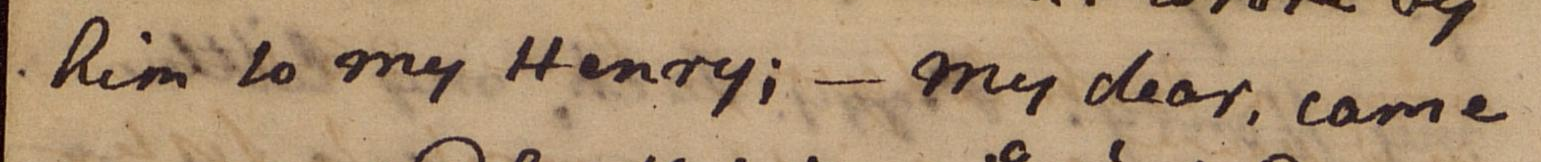him to my Henry;- my dear, came
